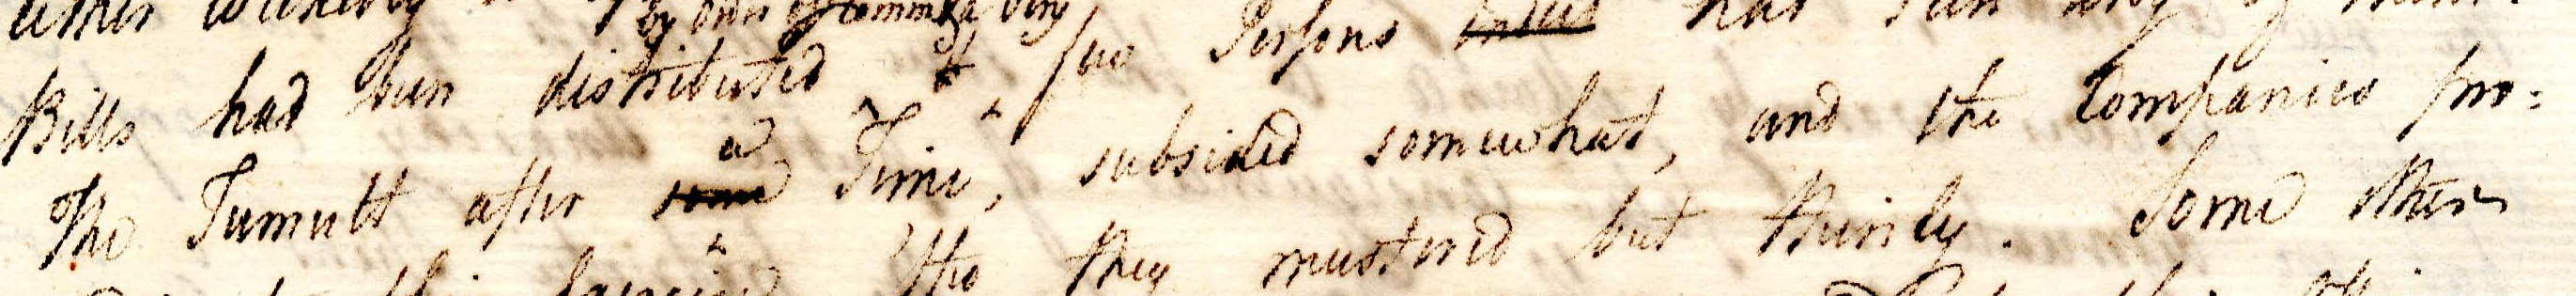The Tumult after some ^ Time, subsided somewhat and the Companies pro-
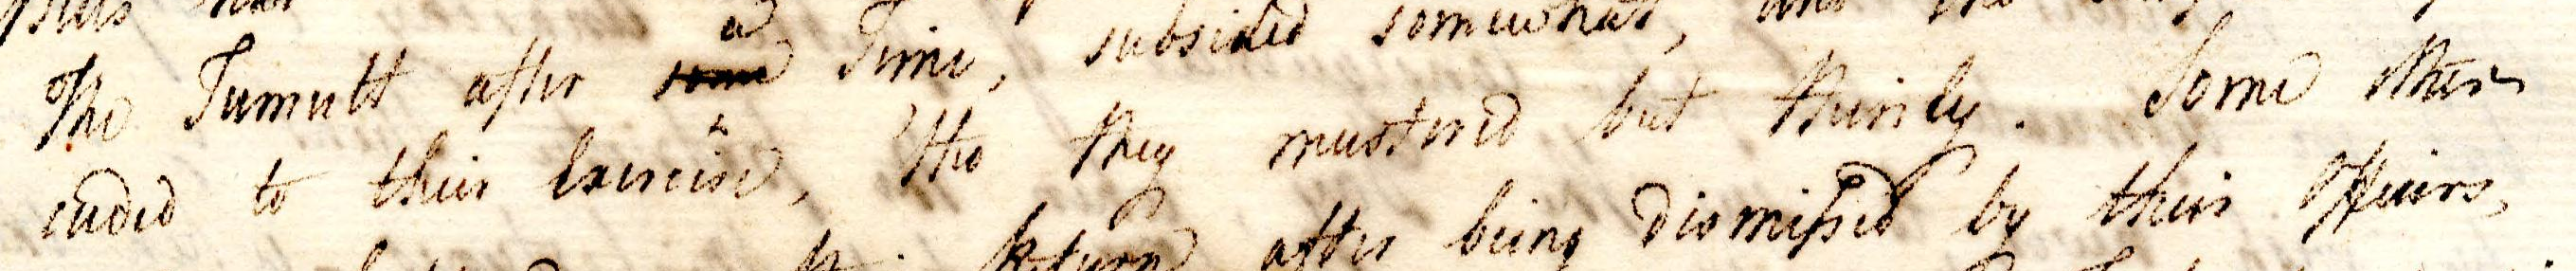-ceeded to their Exercise, 'tho they mustered but thinly. Some other
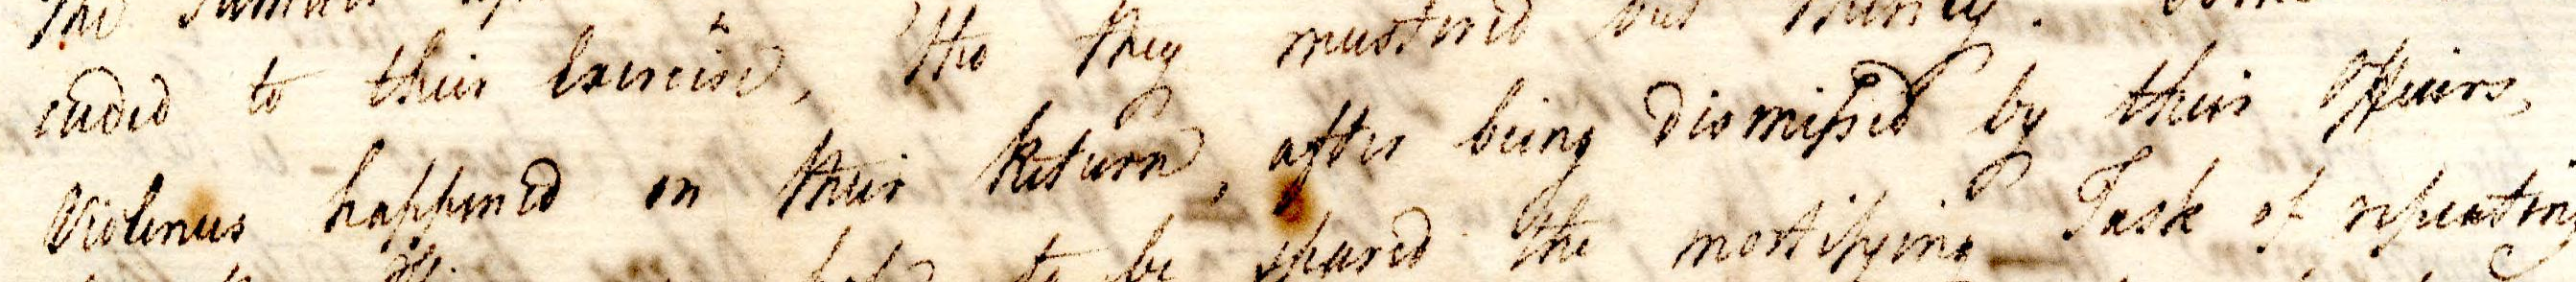Violences happened on their Return after being dismissed by their Officers
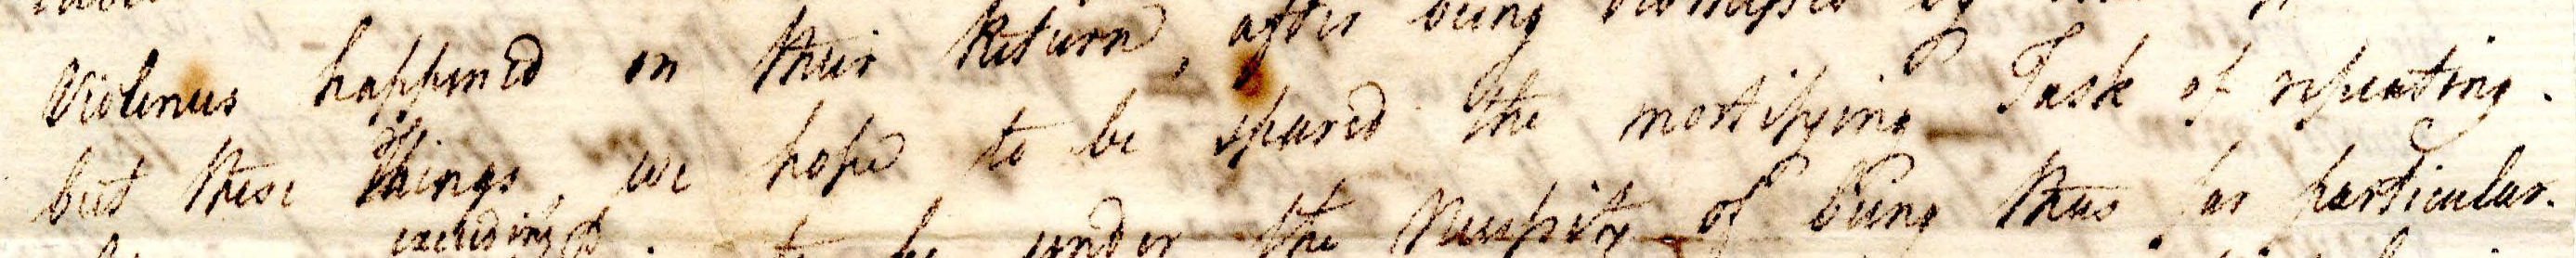but these things, we hope to be spared the mortifying Task of repeating.
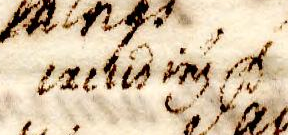exceeding
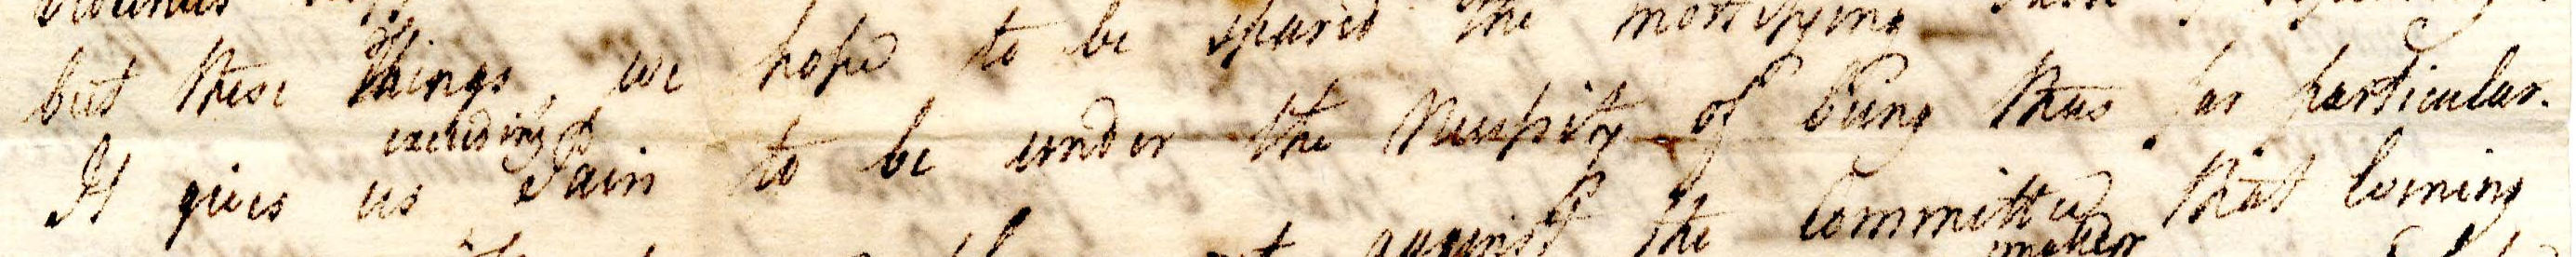It gives us ^ Pain to be under the Necessity of being thus so particular
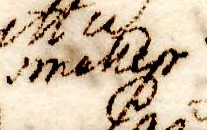melllg
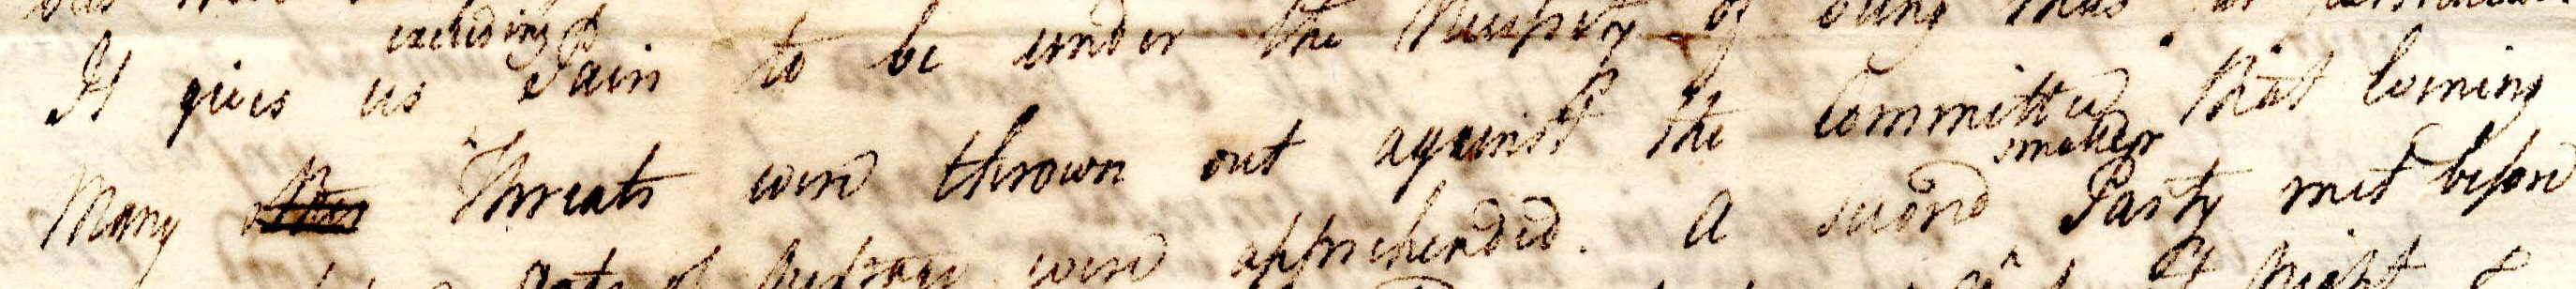Many other threats were thrown out against the Committee that Evening
